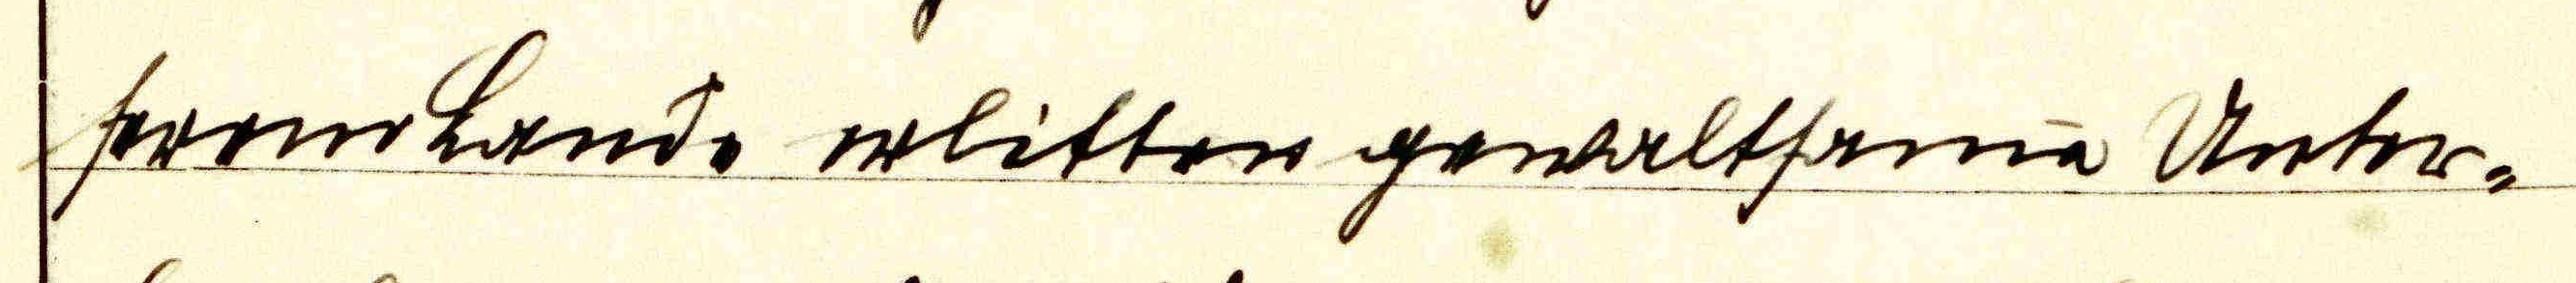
serem Lande erlitten gewaltsame Unter-
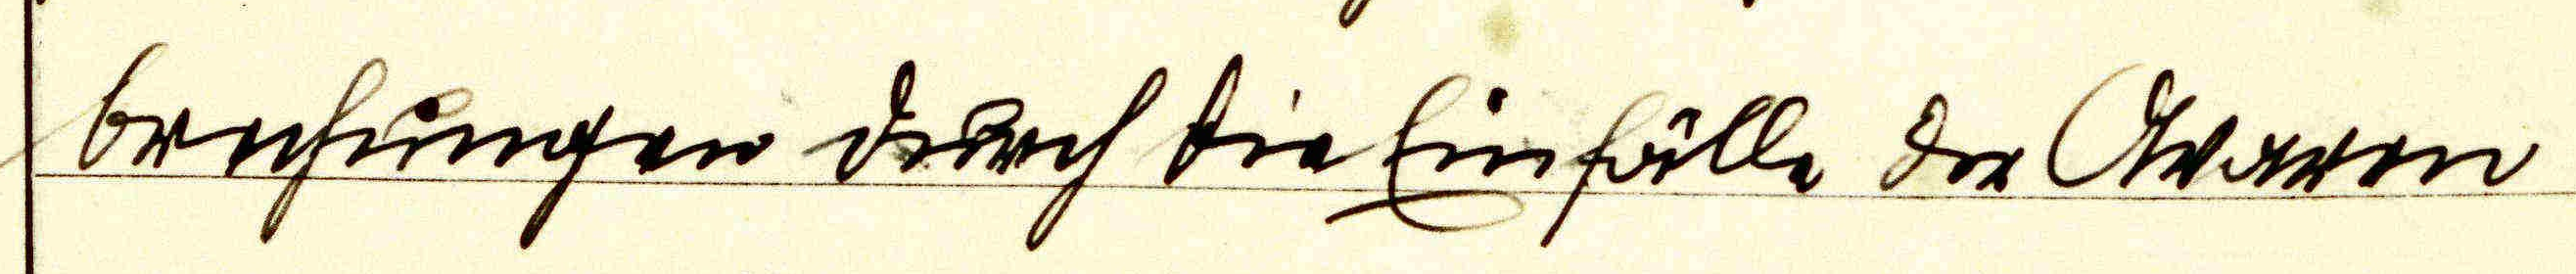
brechungen durch die Einfälle der Avaren
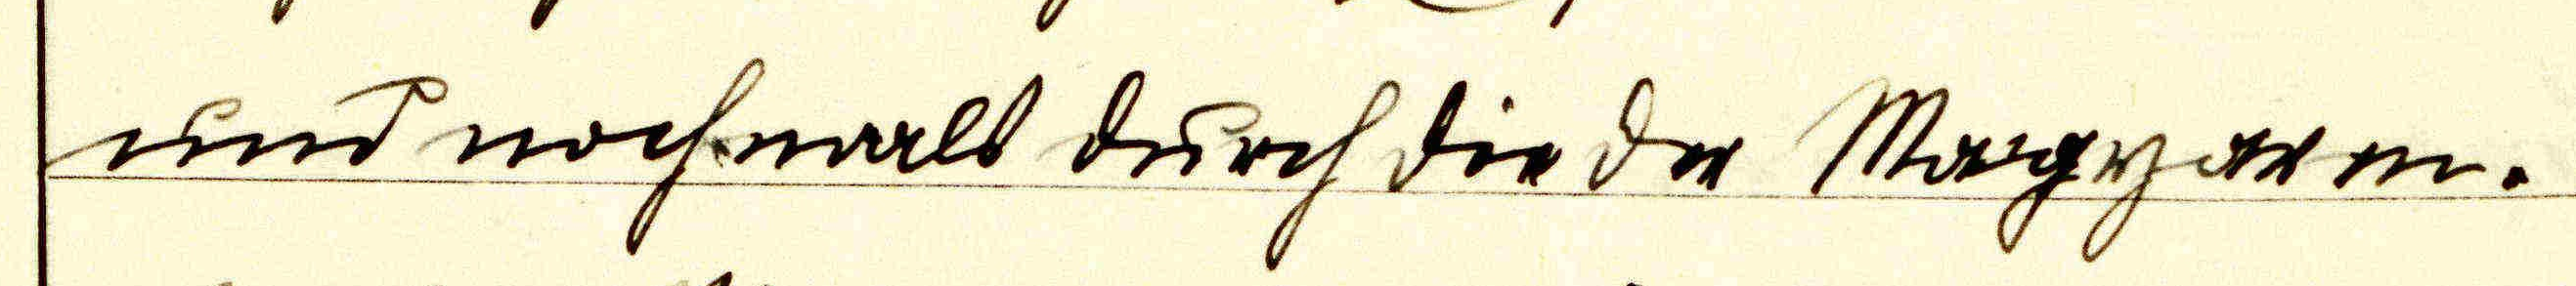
und nochmals durch die der Magyaren.
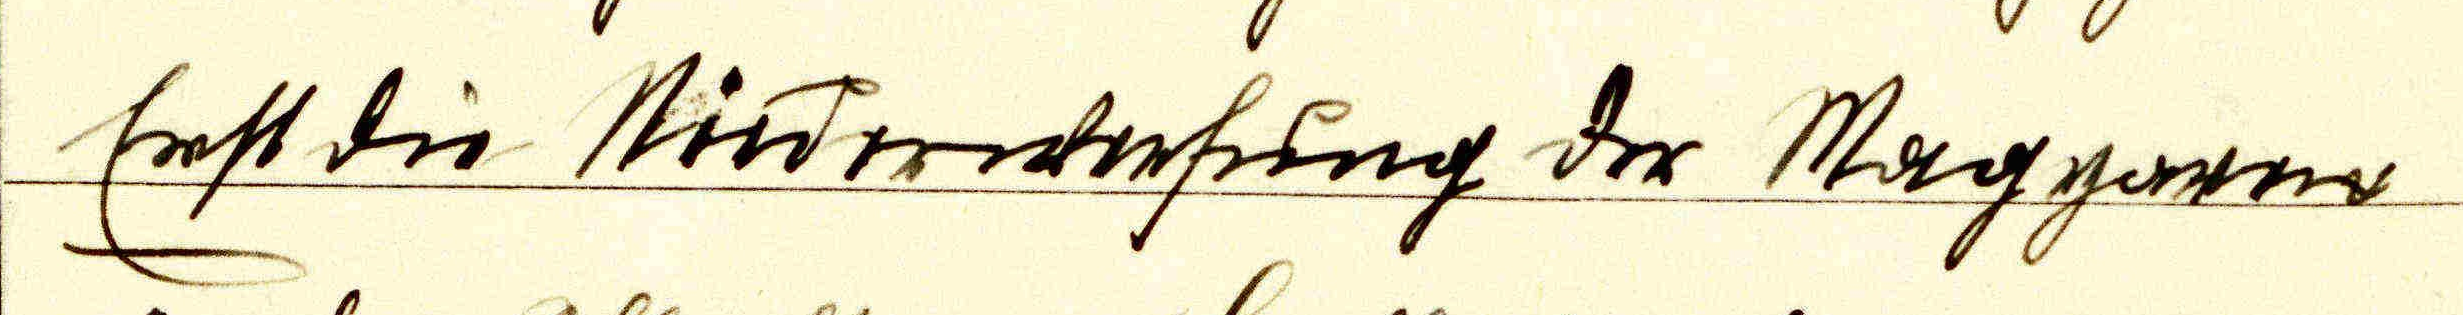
Erst die Niederwerfung der Magyaren
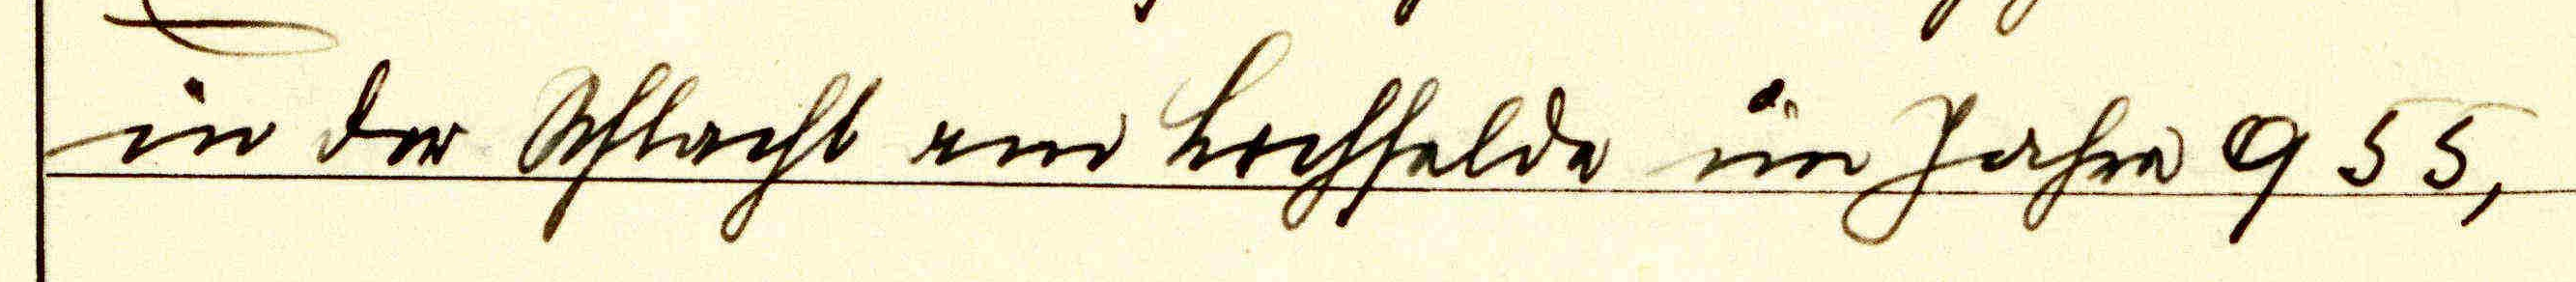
in der Schlacht am Lechfelde im Jahre 955,
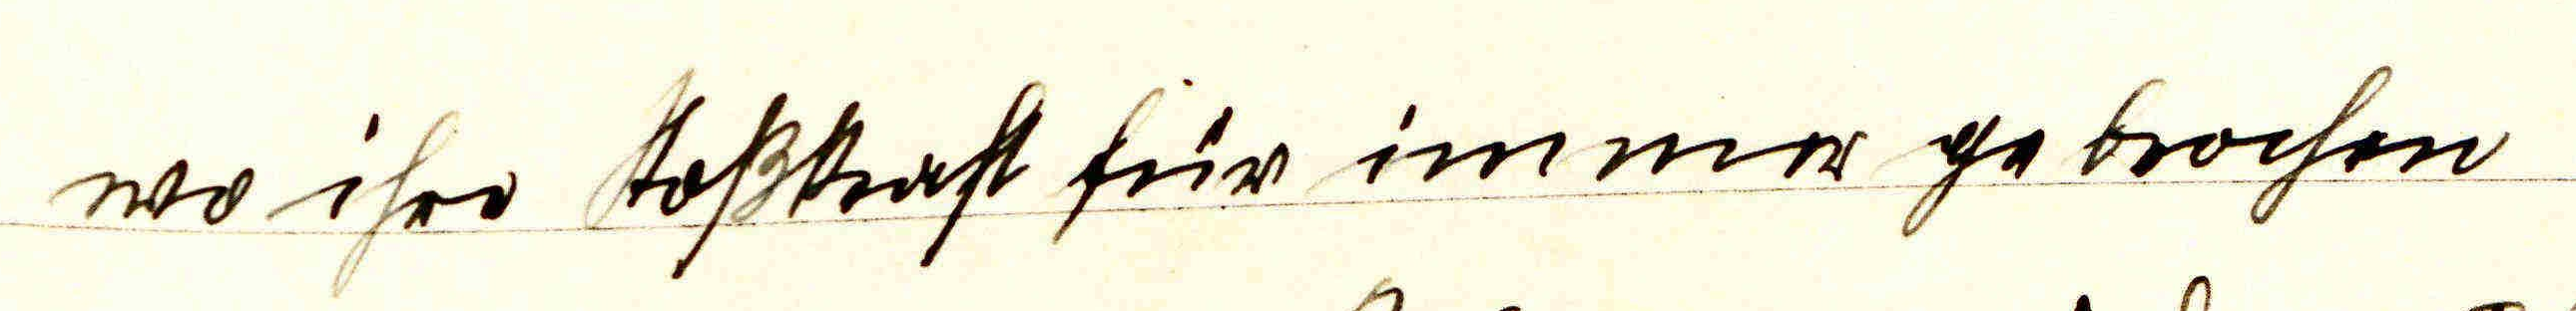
wo ihre Stoßkraft für immer gebrochen
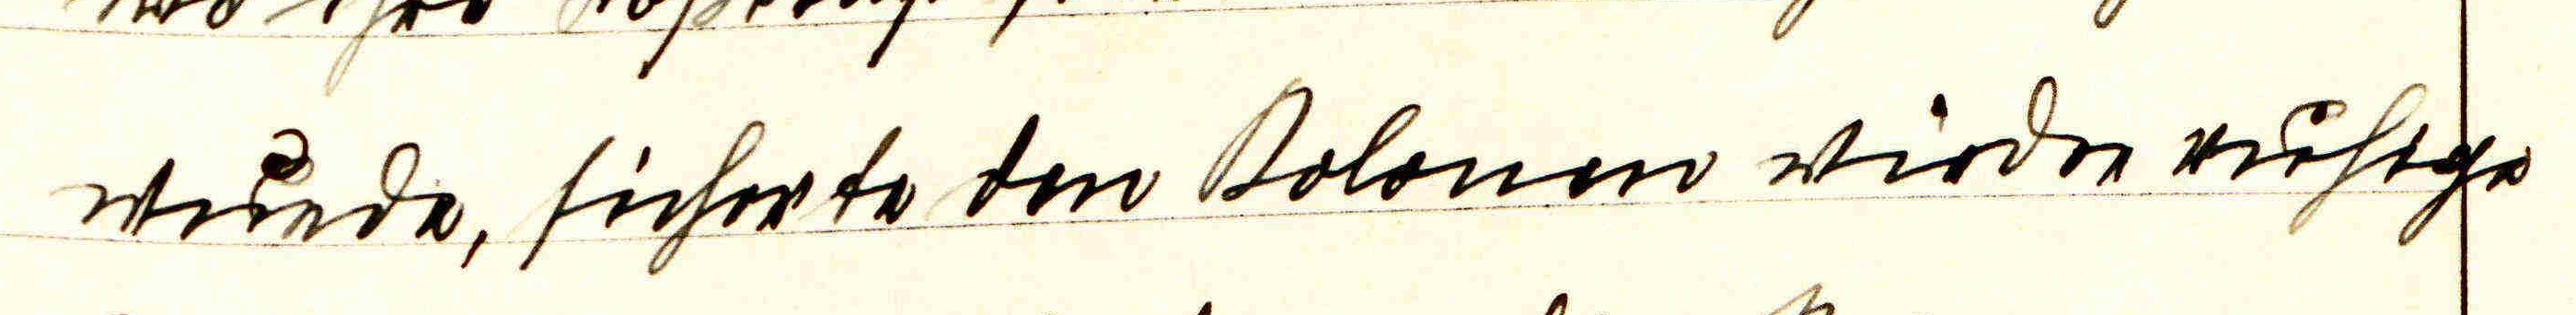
wurde, sicherte den Kolonen wieder ruhige
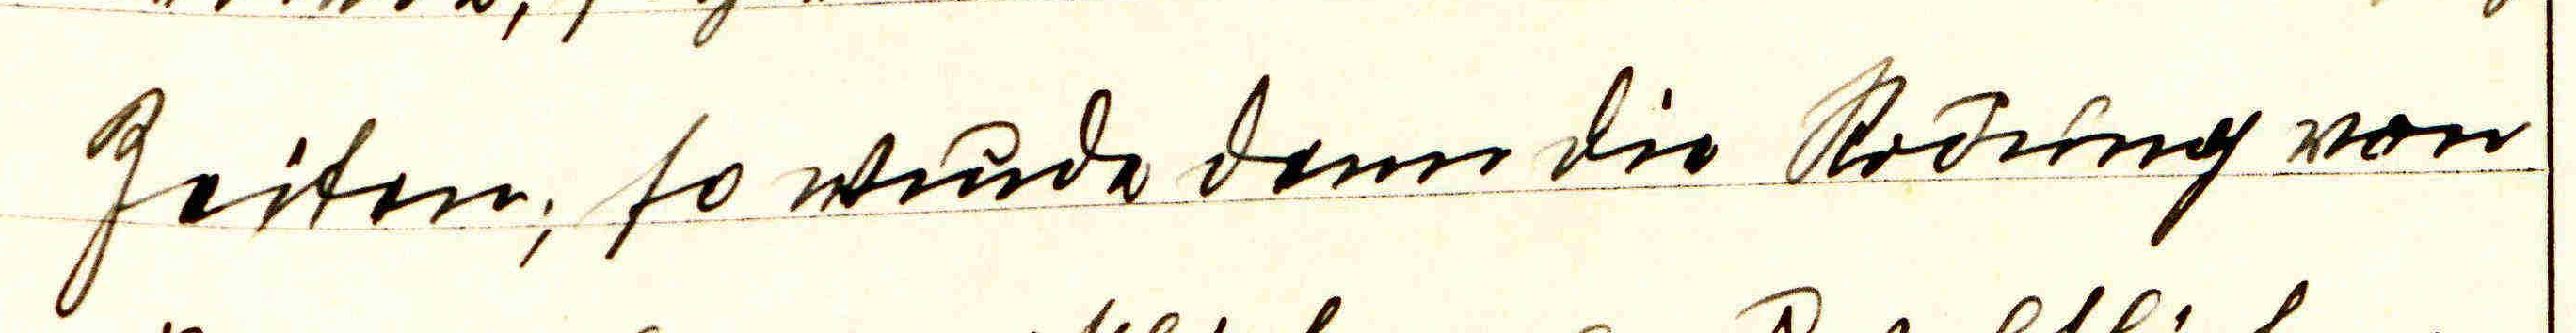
Zeiten; so wurde denn die Rodung von
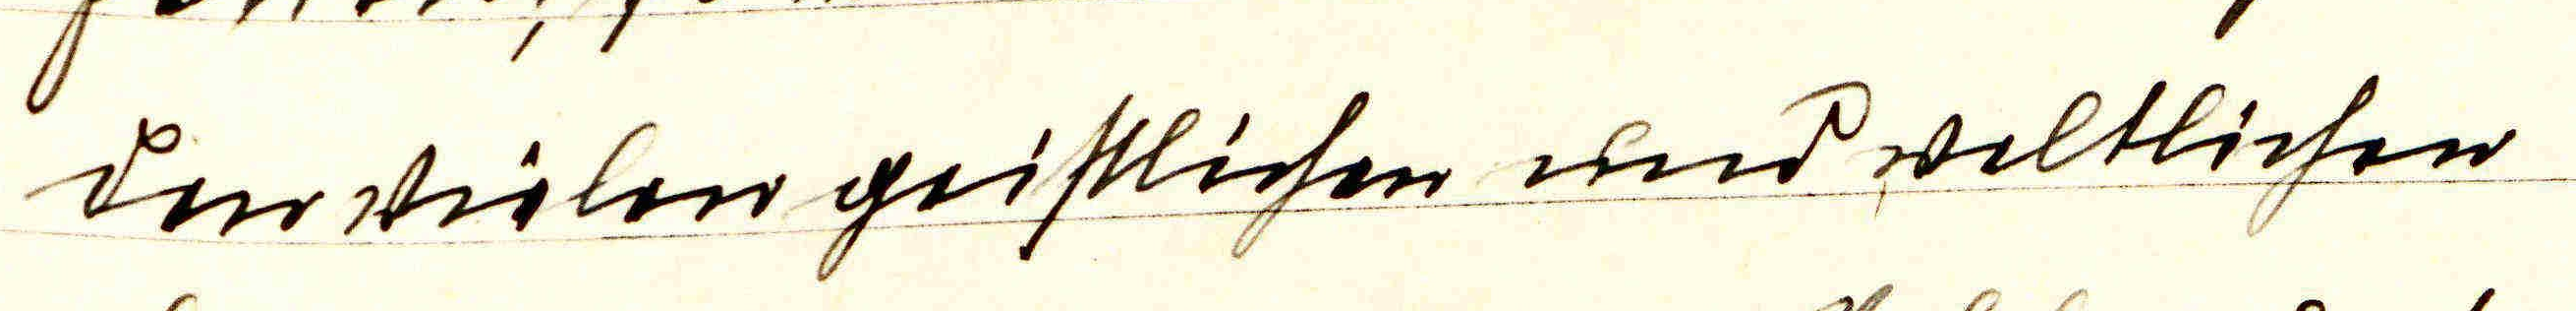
den vielen geistlichen und weltlichen
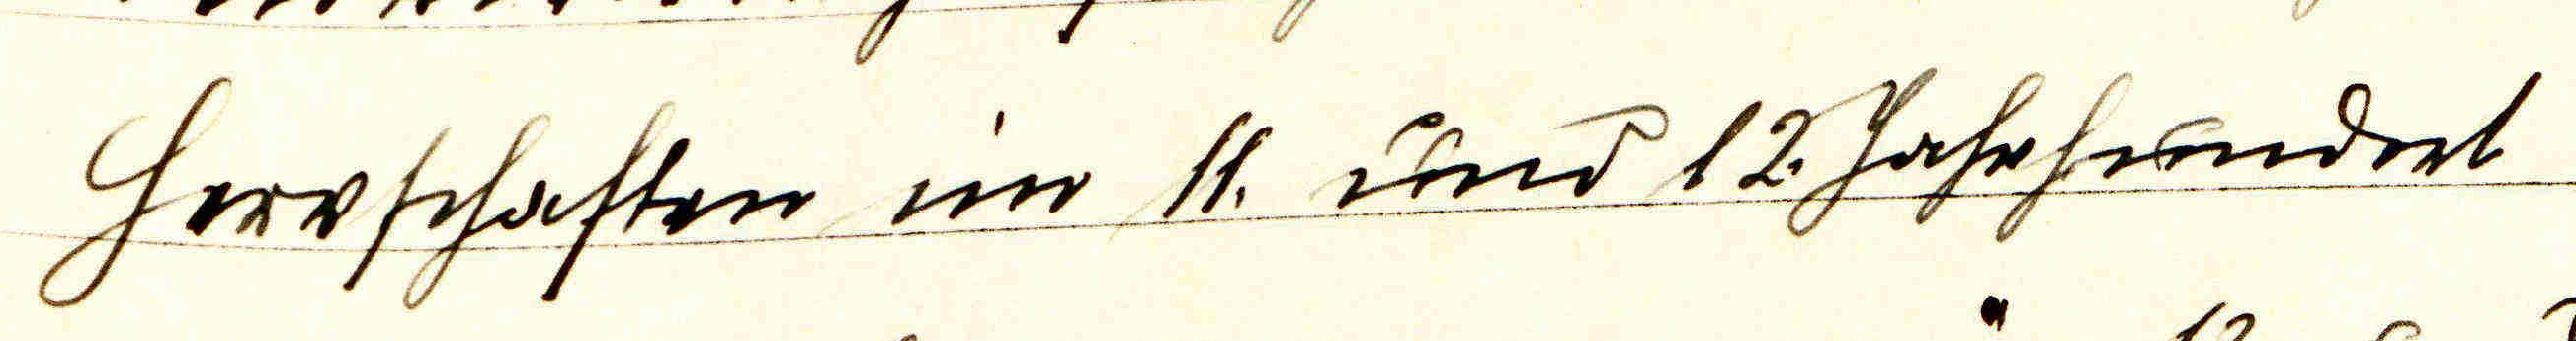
Herrschaften im 11. und 12. Jahrhundert
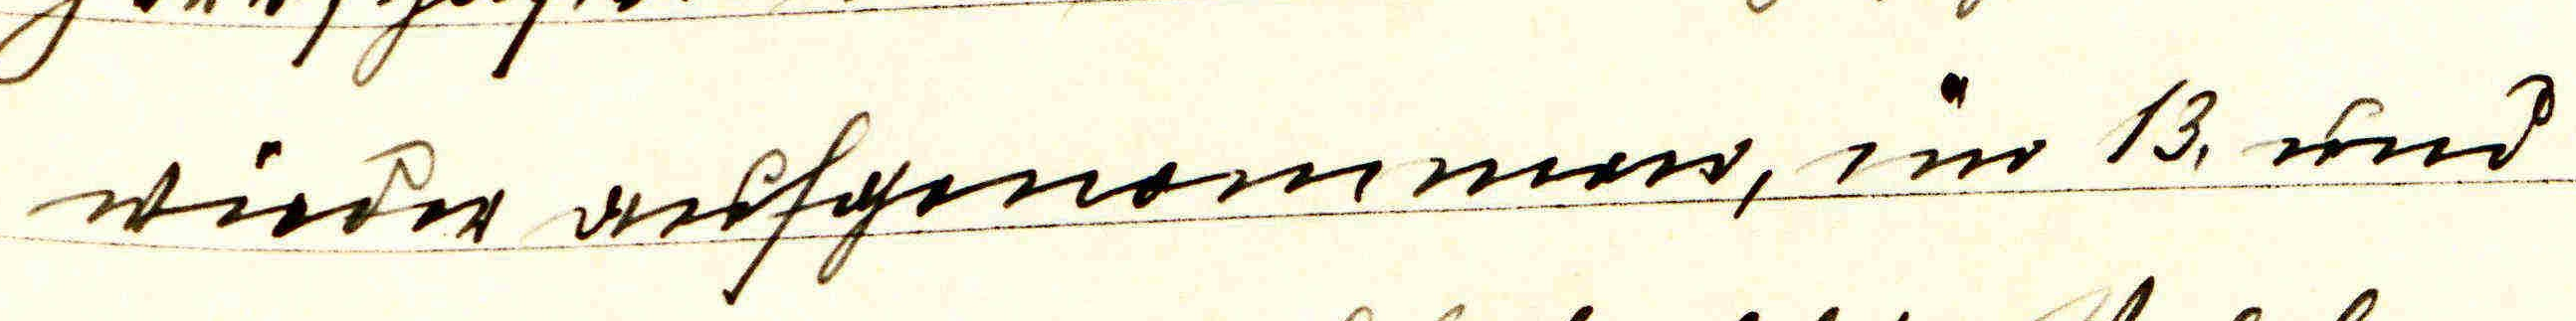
wieder aufgenommen, im 13. und
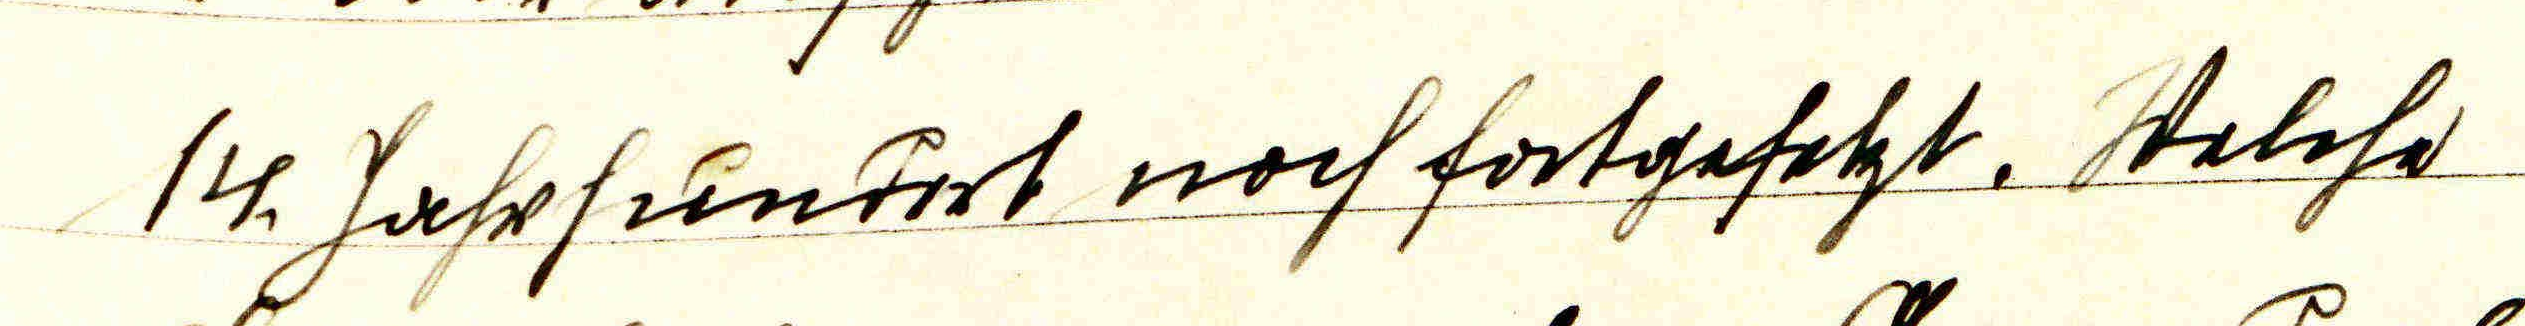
14. Jahrhundert noch fortgesetzt. Welche
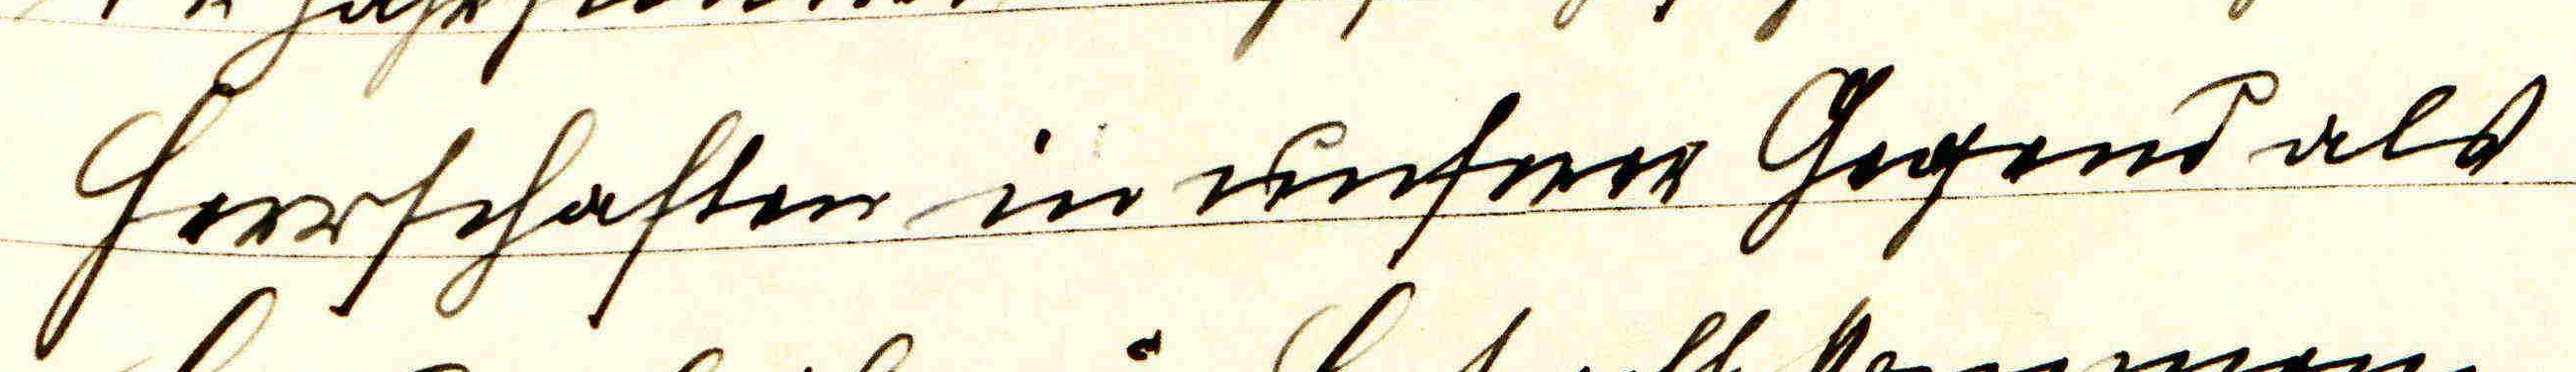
Herrschaften in unserer Gegend als
